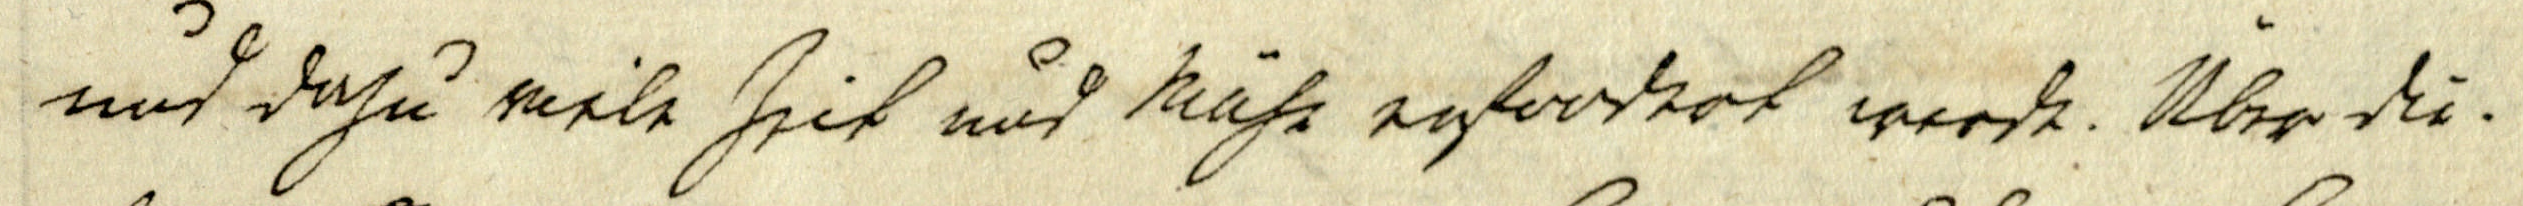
und dazu viele Zeit und Mühe erfordert werde. Über die¬
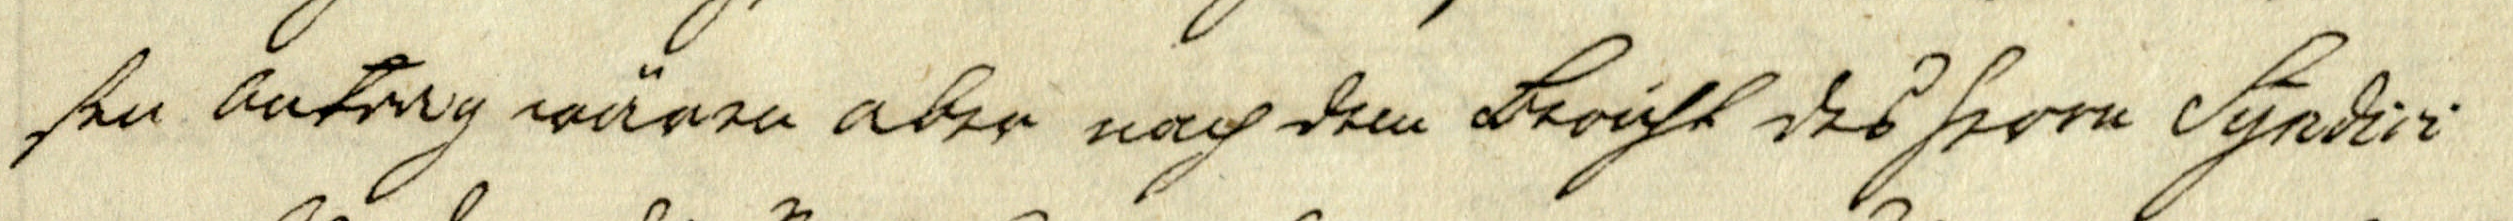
sen Antrag wären aber nach dem Bericht des herrn Sÿndici
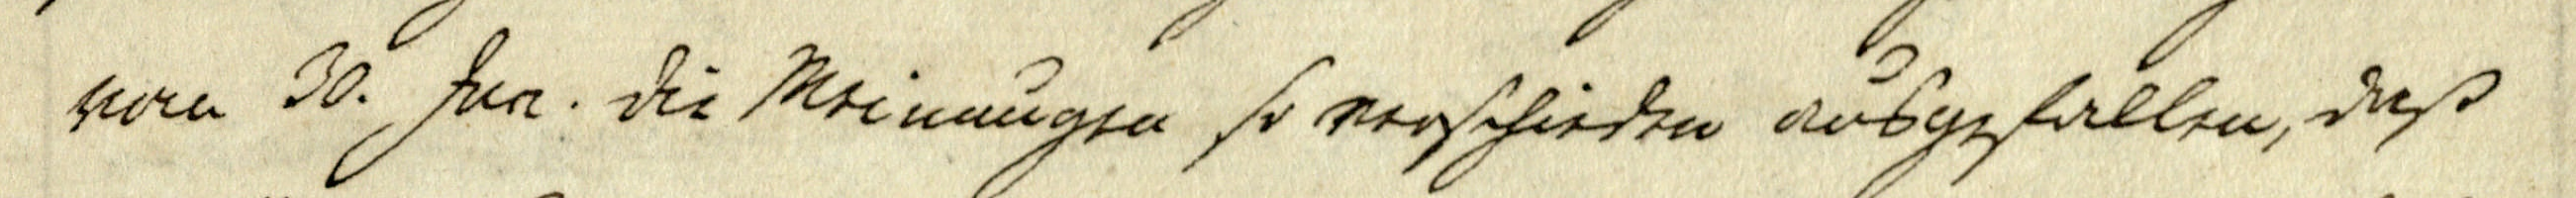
vom 30. Jun. die Meinungen so verschieden ausgefallen, daß
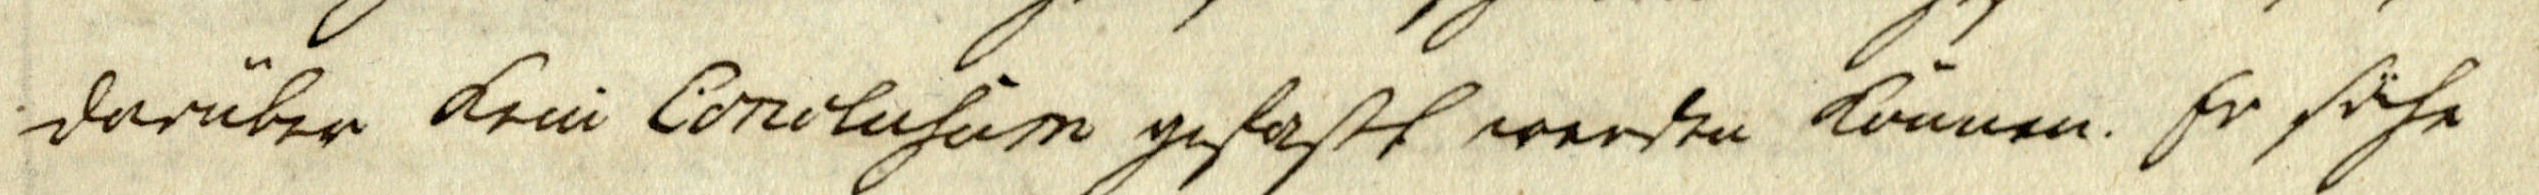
darüber kein Conclusum gefaßt werden können. Er sähe
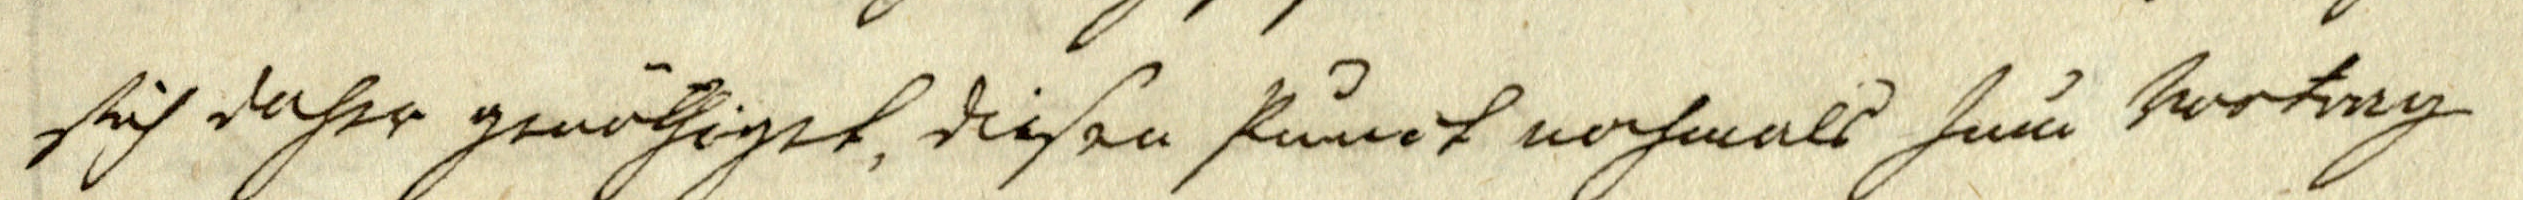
sich daher genöthiget, diesen Punct nochmals zum Vortrag
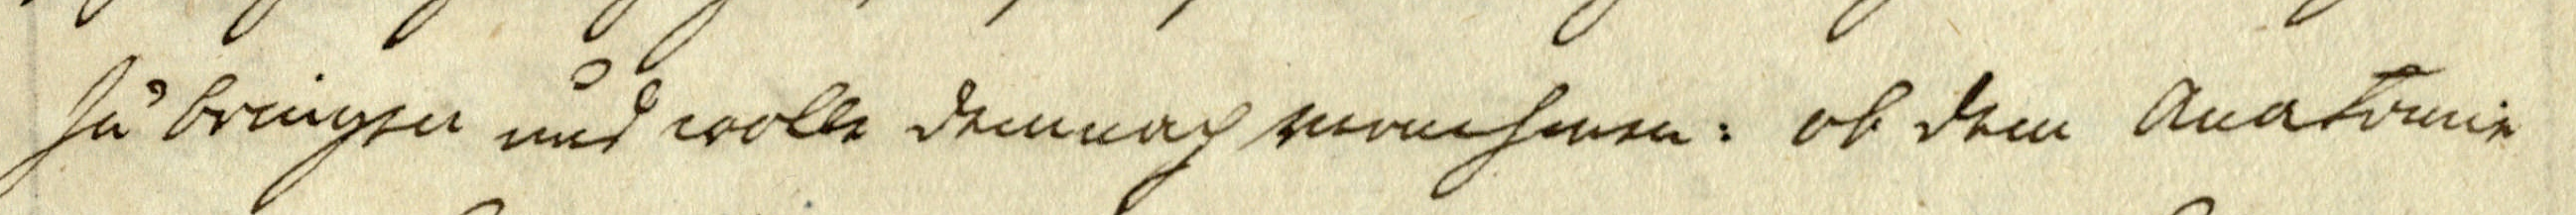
zu bringen und wolle demnach vernehmen: ob dem Anatomie
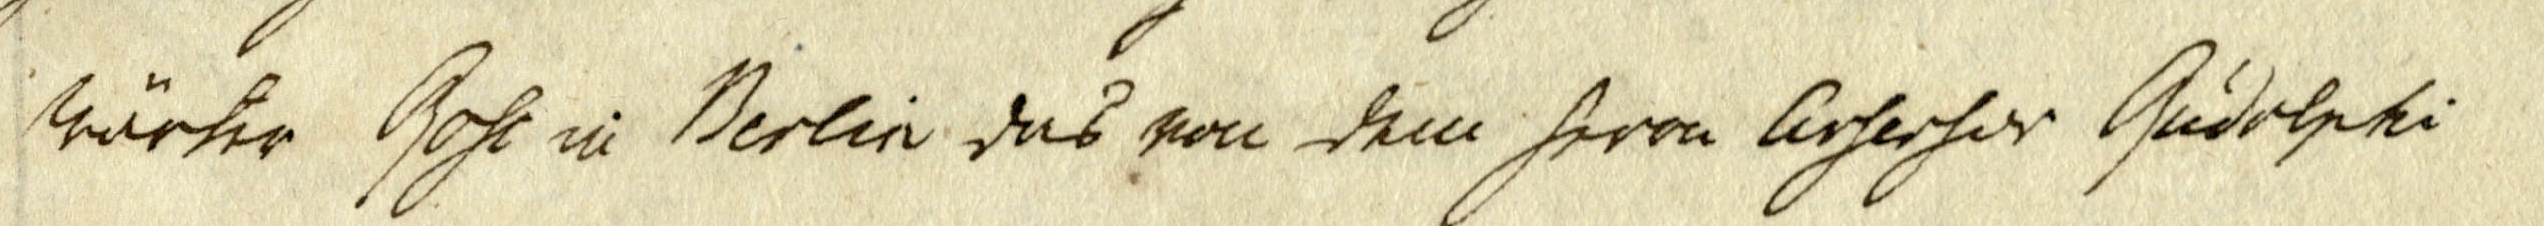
Wärter Rost in Berlin das von dem herrn Assessor Rudolphi
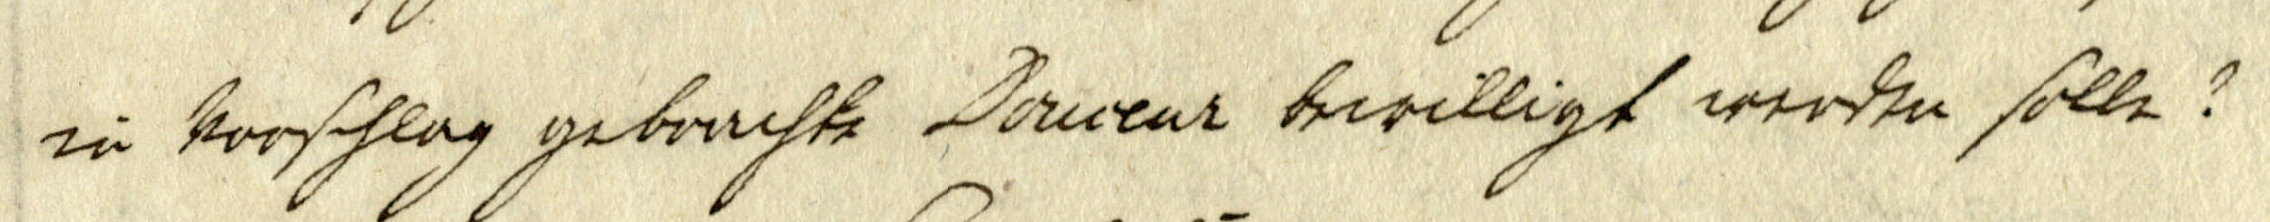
in Vorschlag gebrachte Douceur bewilligt werden solle?
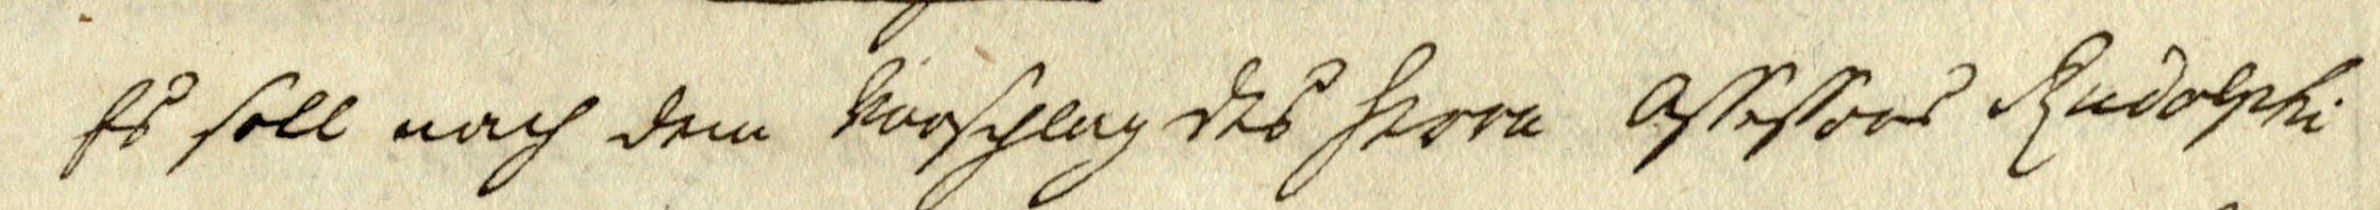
es soll nach dem Vorschlag des herrn Assessors Rudolphi
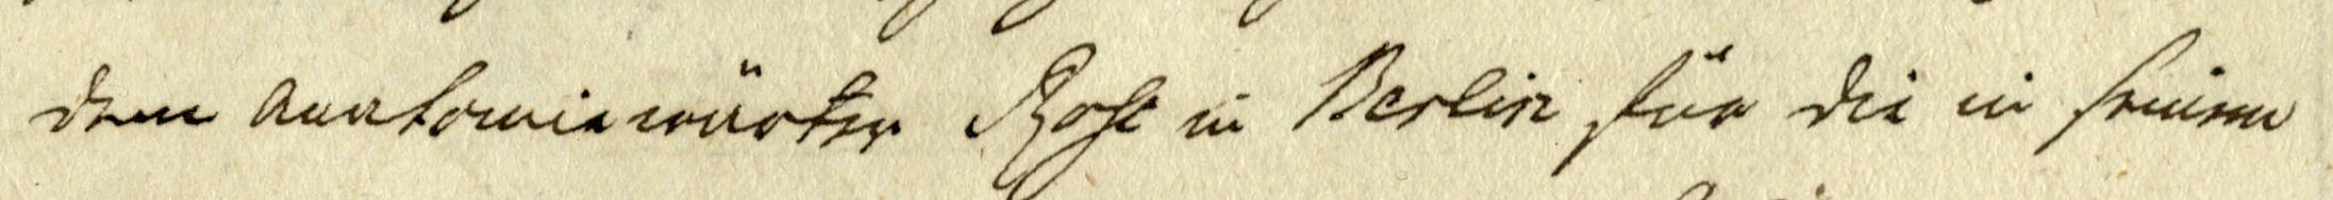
dem Anatomiewärter Rost in Berlin für die in seinem
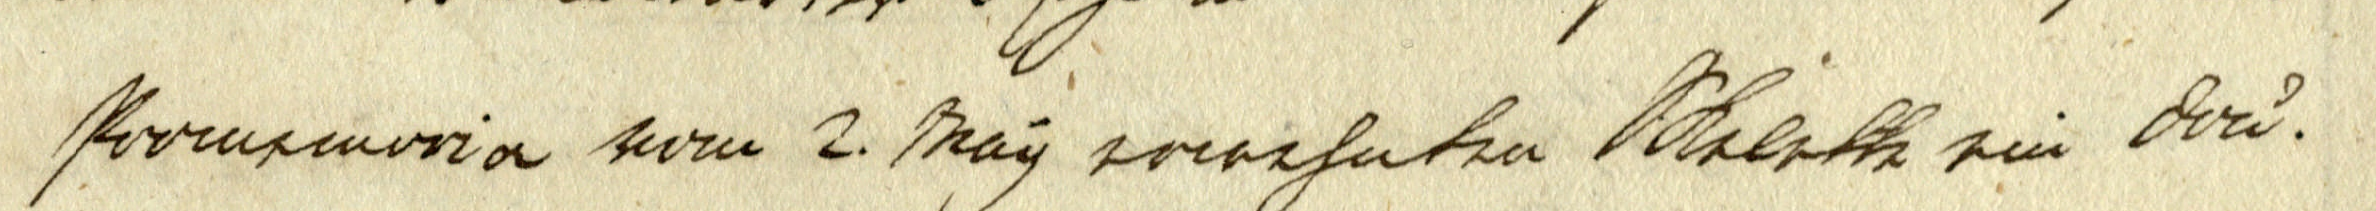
Promemoria vom 2. Maÿ erwehnten Skelette ein dou¬
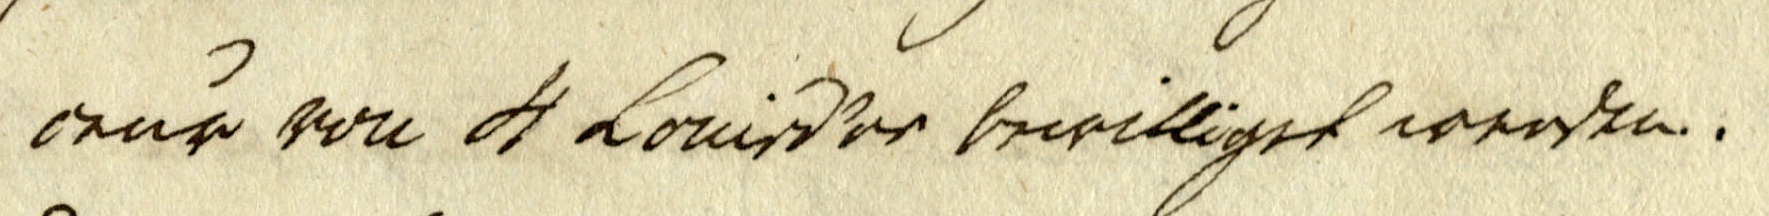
ceur von 4 Louisdor bewilliget werden.
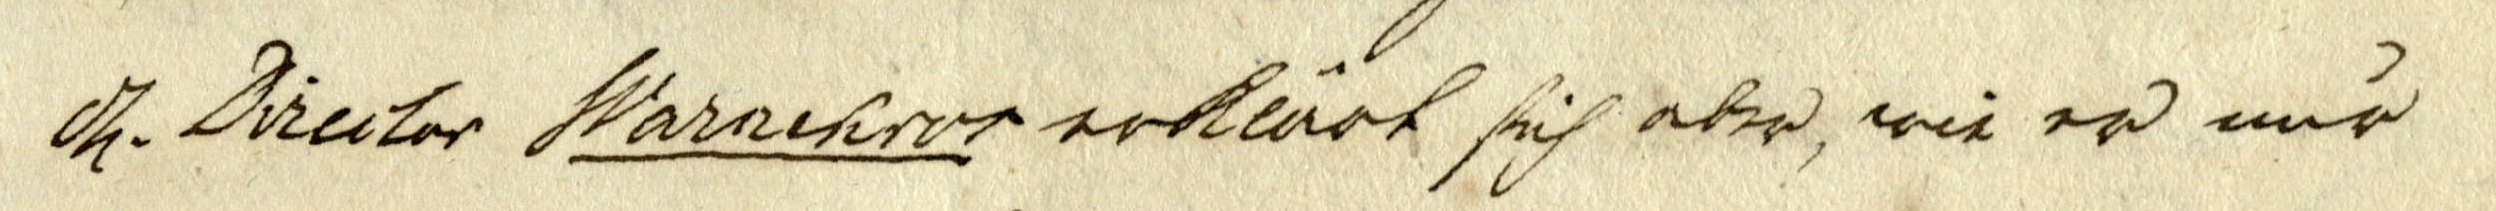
dh. Director Warnekros erklärt sich aber, wie er nur
